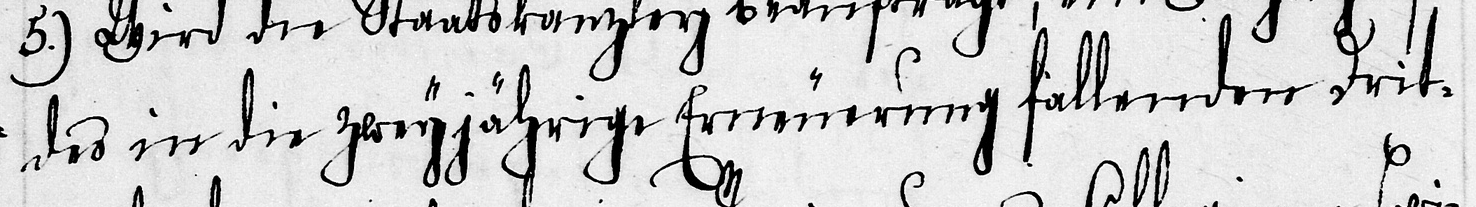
des in die zweyjährige Erneuerung fallenden Drit¬
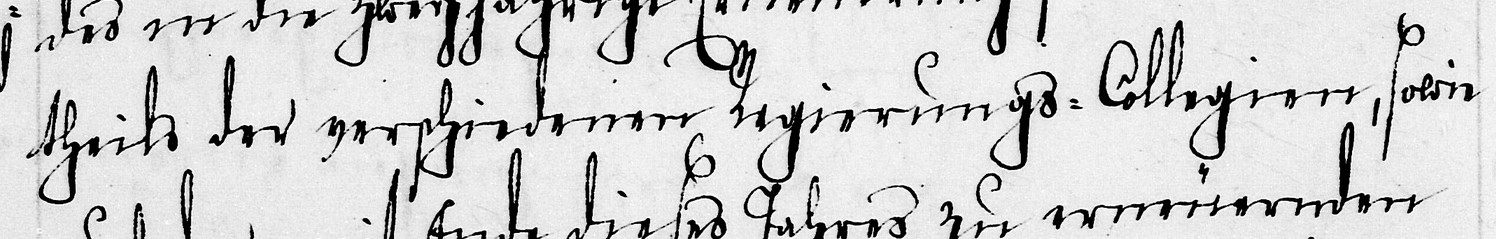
theils der verschiedenen Regierungs-Collegien, sowie
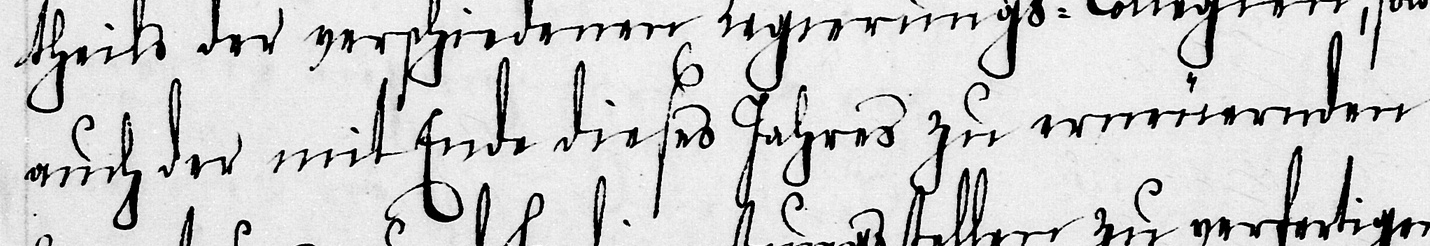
auch der mit Ende dieses Jahres zu erneuernden
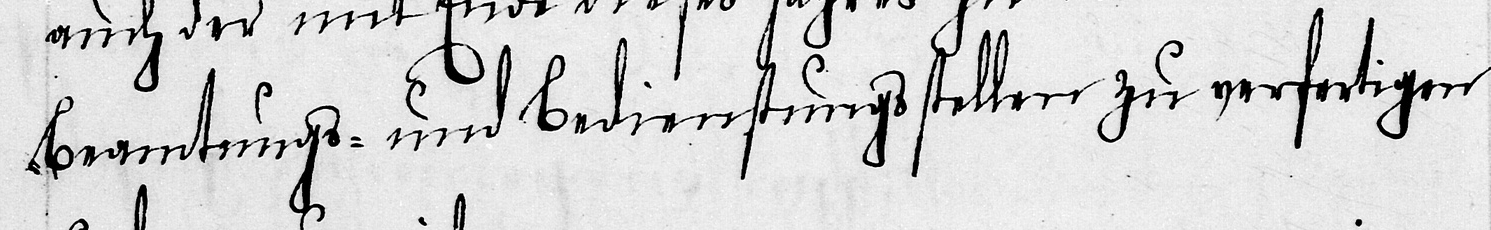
Beamtungs- und Bedienstungsstellen zu verfertigen
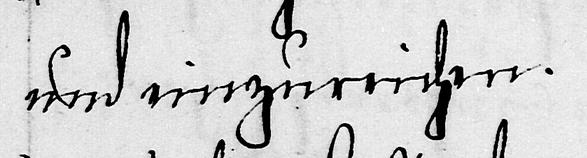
und einzureichen.
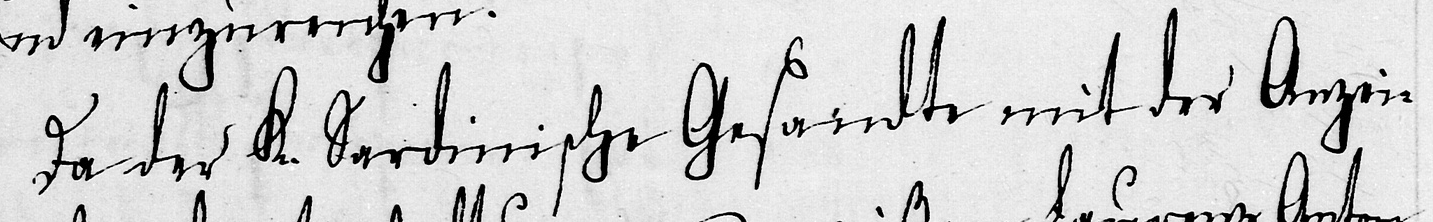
Da der K. Sardinische Gesandte mit der Anzeig¬
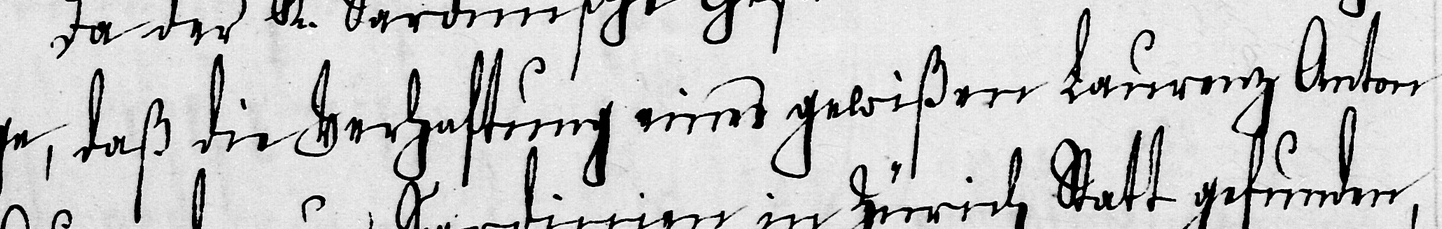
e, daß die Verhaftung eines gewissen Laurenz Anton
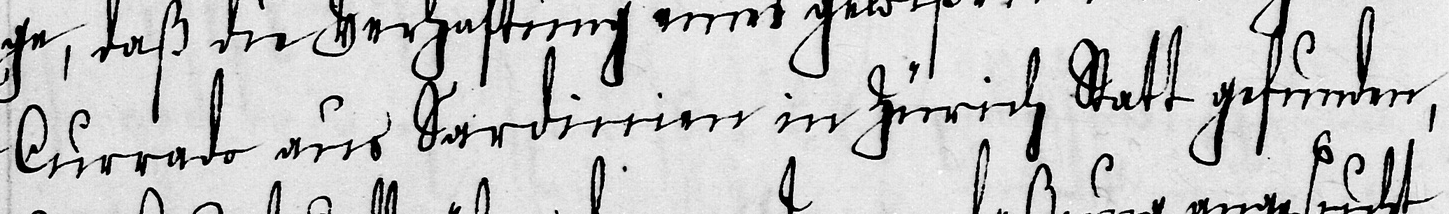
Currado aus Sardinien in Zürich Statt gefunden,
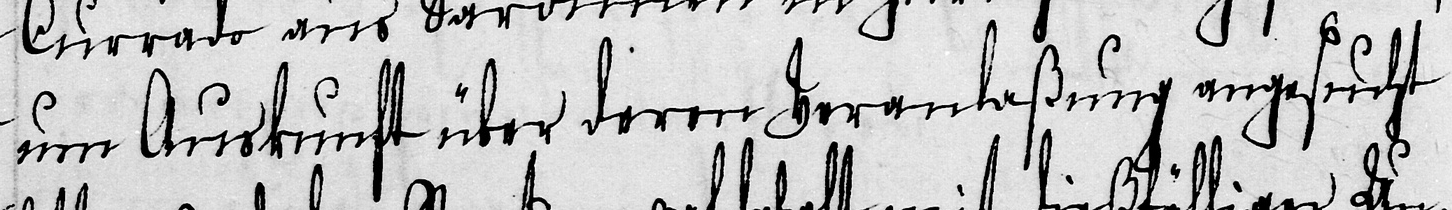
um Auskunft über deren Veranlaßung angesucht
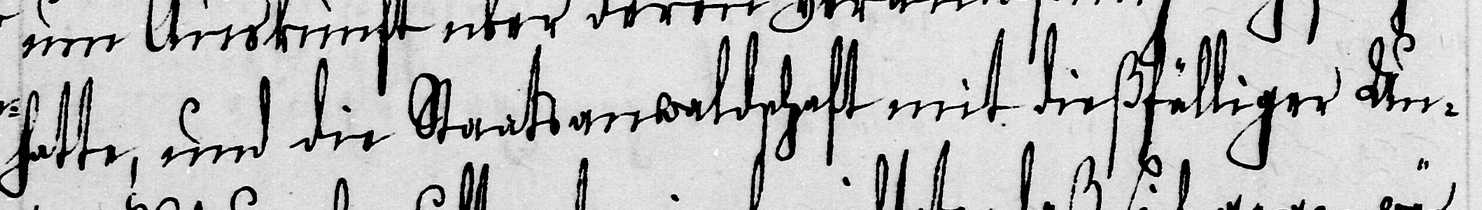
atte, und die Staatsanwaldschaft mit dießfälliger Un¬
